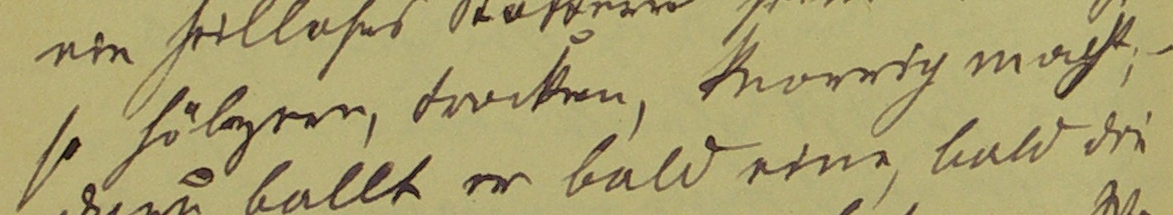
so hölzern, trocken knorrig macht,
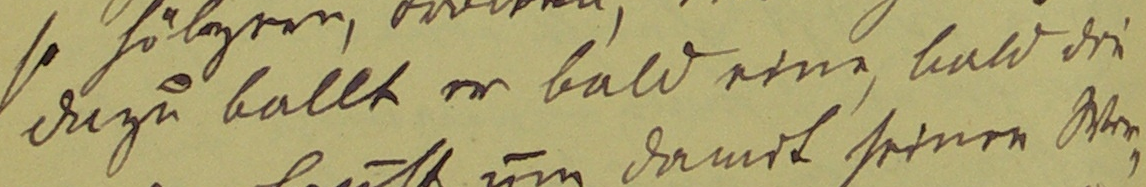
dazu ballt er bald eine, bald die
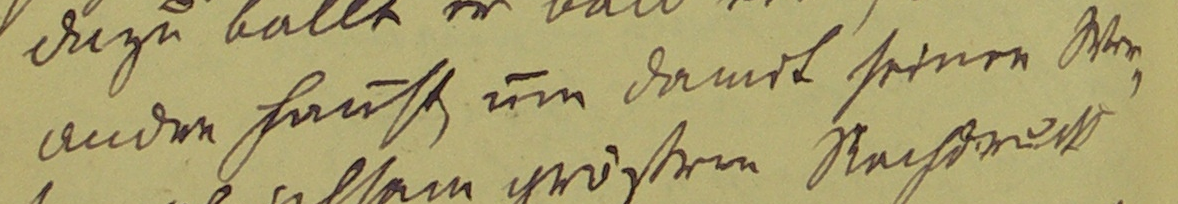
andere Faust um damit seinen Wor¬
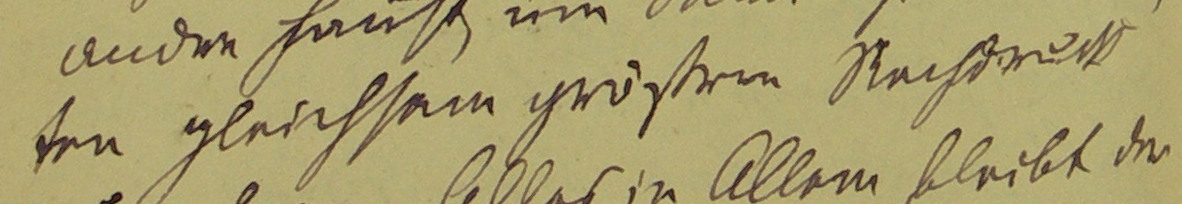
ten gleichsam größren Nachdruck
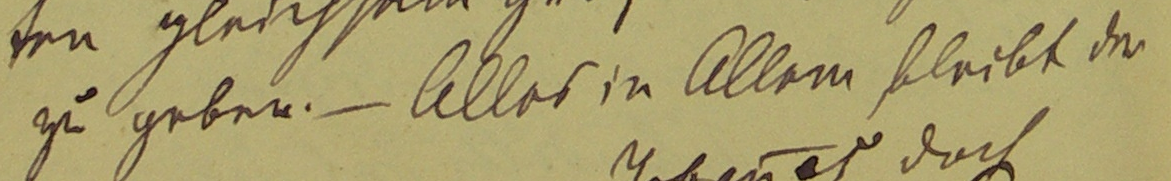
zu geben.- Alles in Allem bleibt der
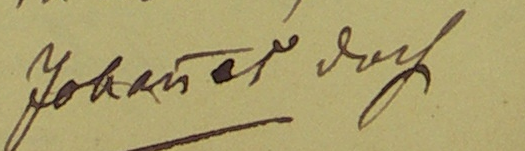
Johannes doch
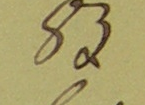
83
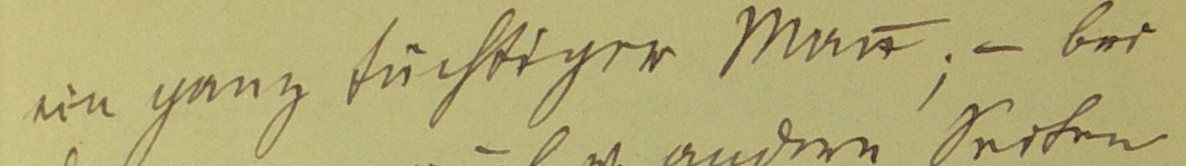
ein ganz tüchtiger Mann;- bei
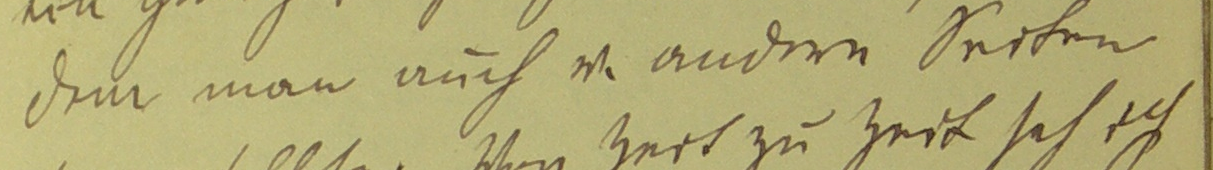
dem man auch nach anderen Seiten
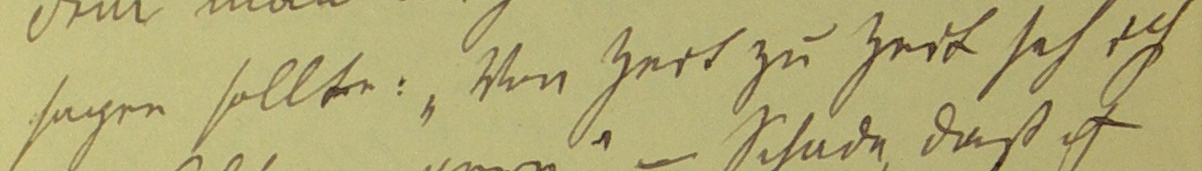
fragen sollte:“ Von Zeit zu Zeit sah ich
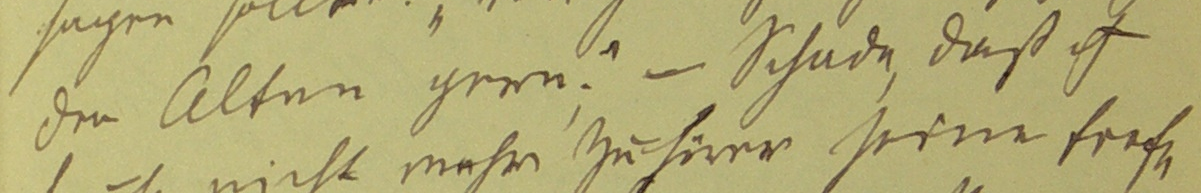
den Alten gern“-Schade daß auch
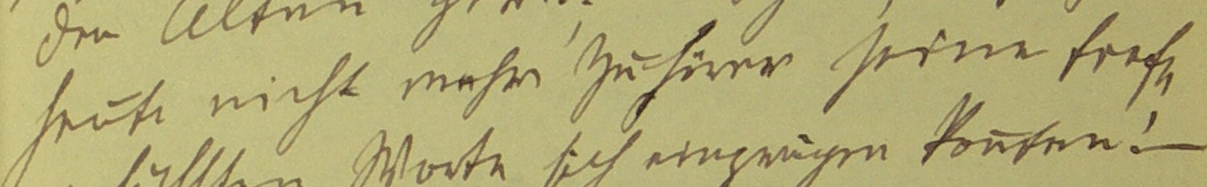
heute nicht mehr Zuhörer seine tief en
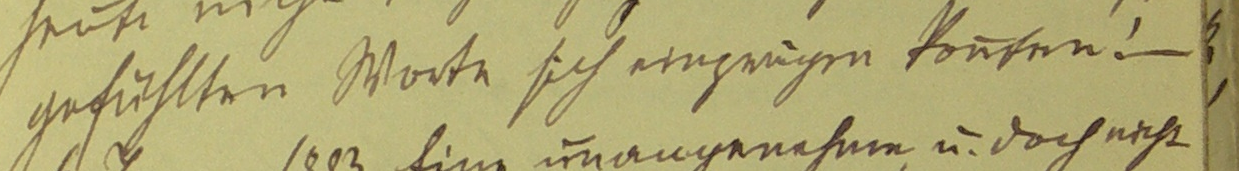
gefüllten Worte sich einprägen konnten.
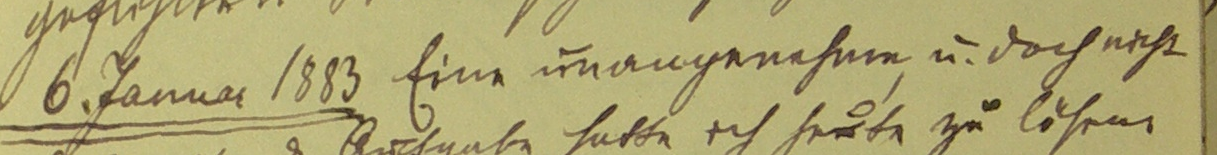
6. Januar 1883. Eine unangenehme und doch nicht
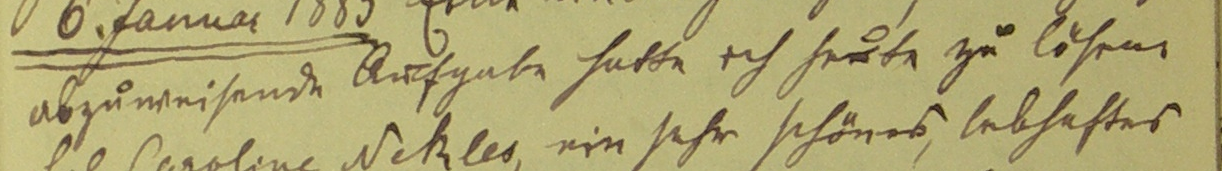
abzuweisende Aufgabe hatte ich heute zu lösen.
